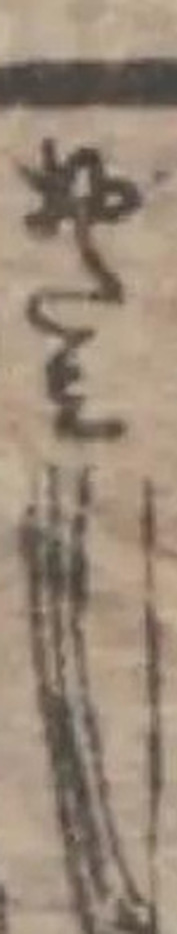おたミ
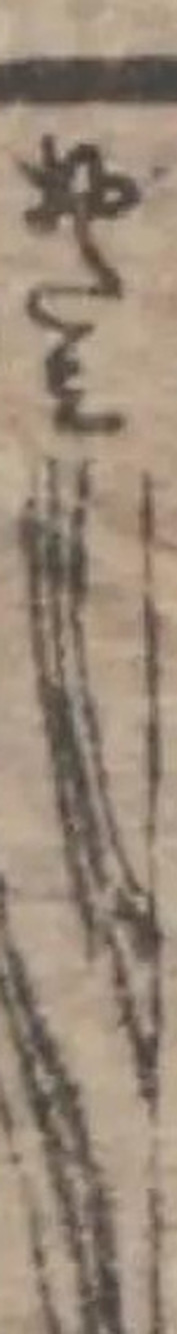おたミ
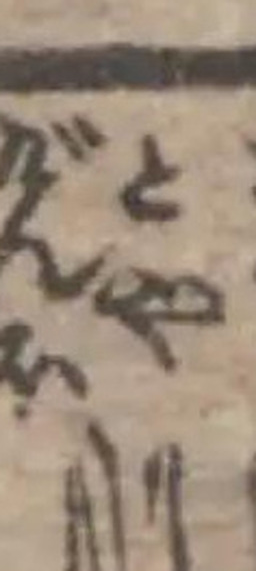げんほ
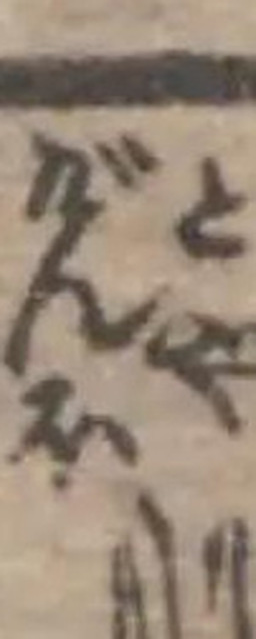げんほ
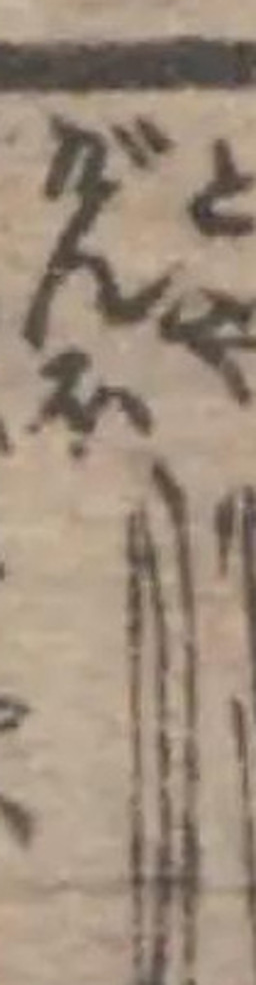げんほ
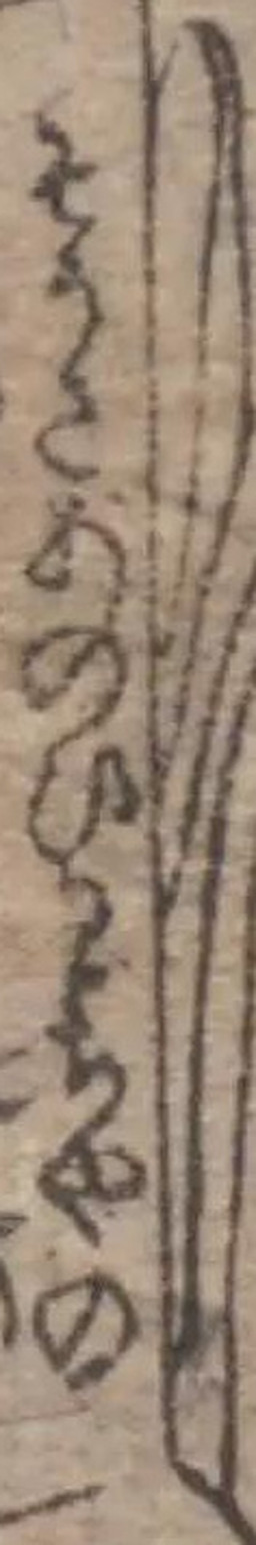そうたあのひわちやの
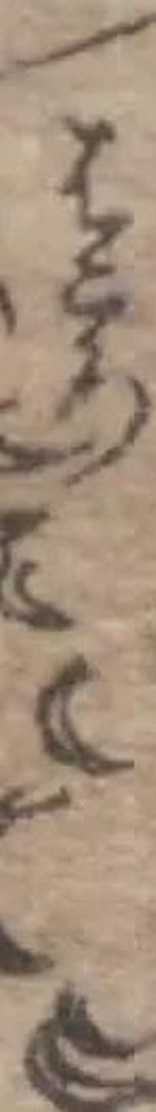はころ
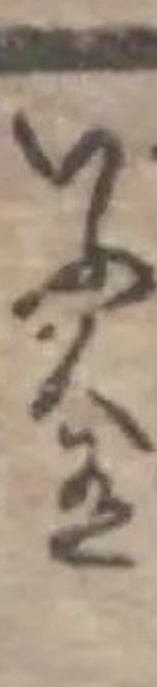いふ人有
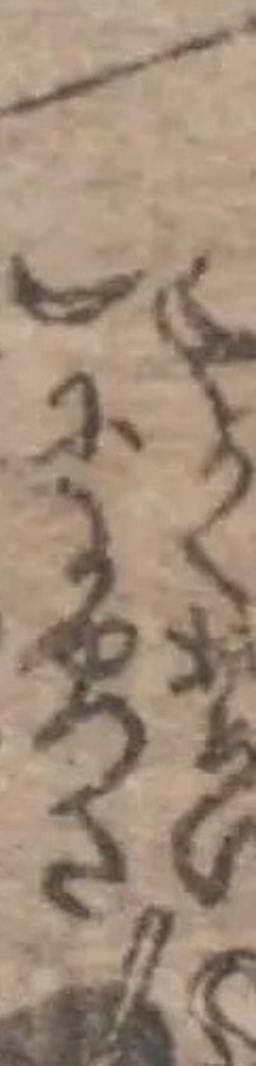ににやつた
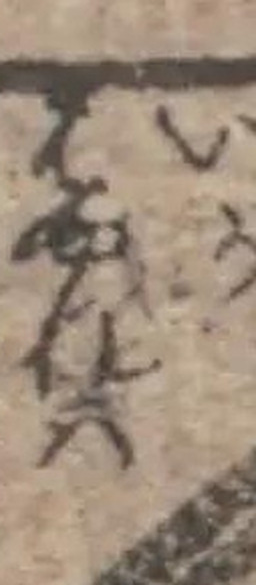はやれハ
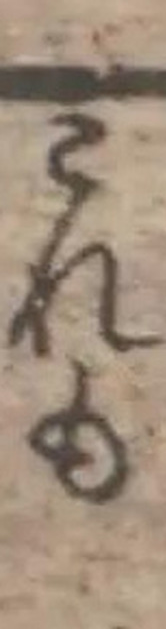これも
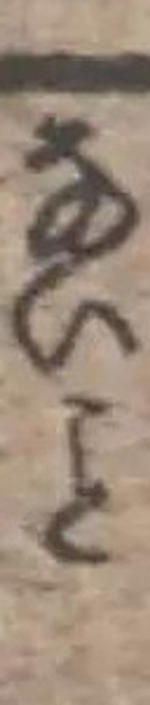ないこと
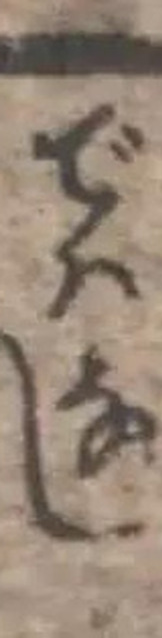でハなし

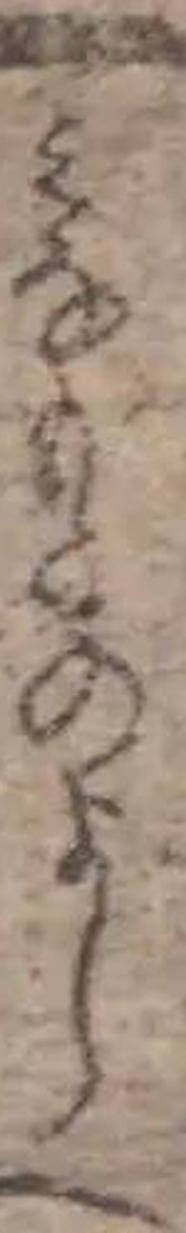ミなもとのよし
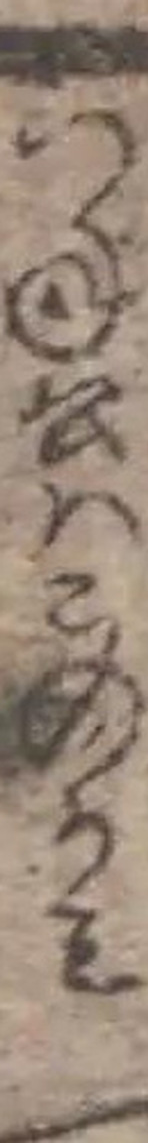つね公ハこのかミ
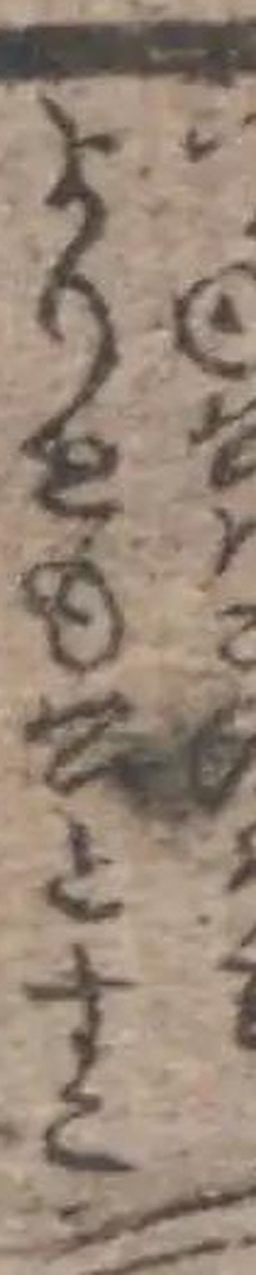よりとも公とすこ
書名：草紙の曙 3巻
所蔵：国立国会図書館 National Diet Library, JAPAN
